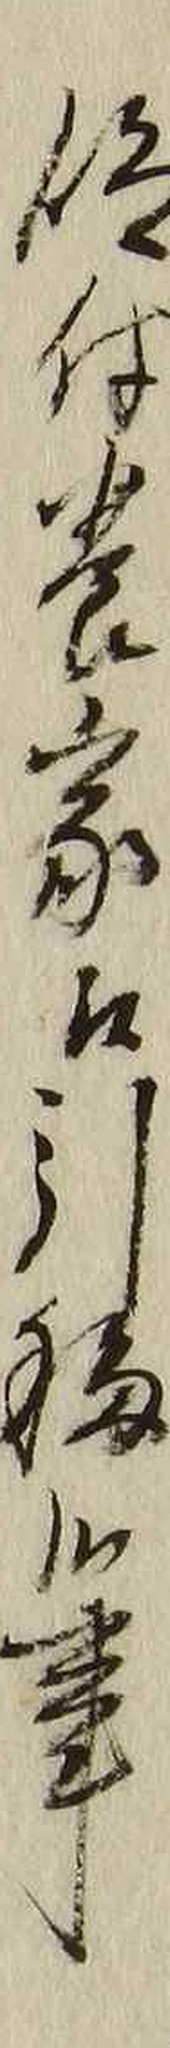仰付養家江引移候事
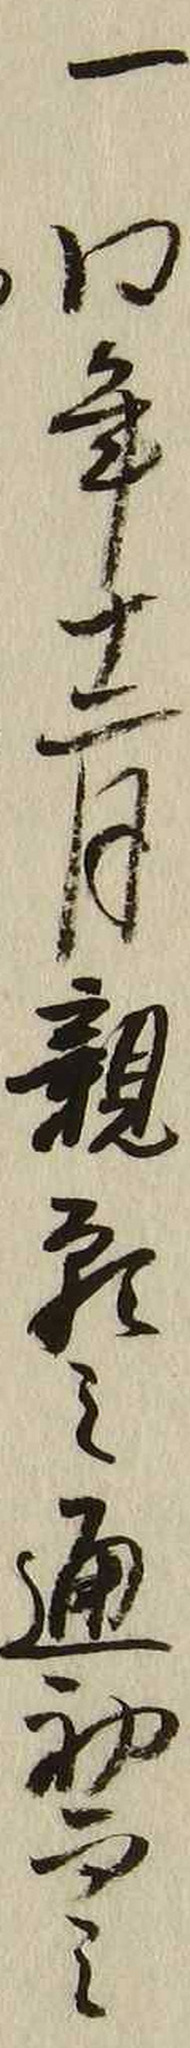一同年十二月親願之通初而之
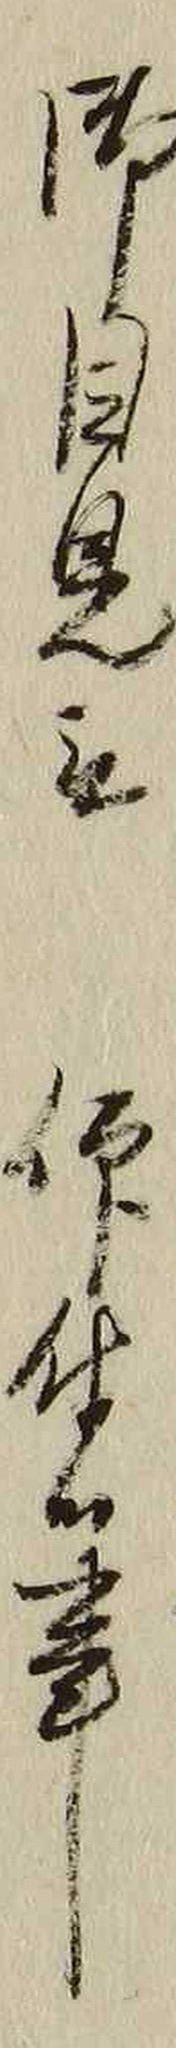御目見被仰付候事
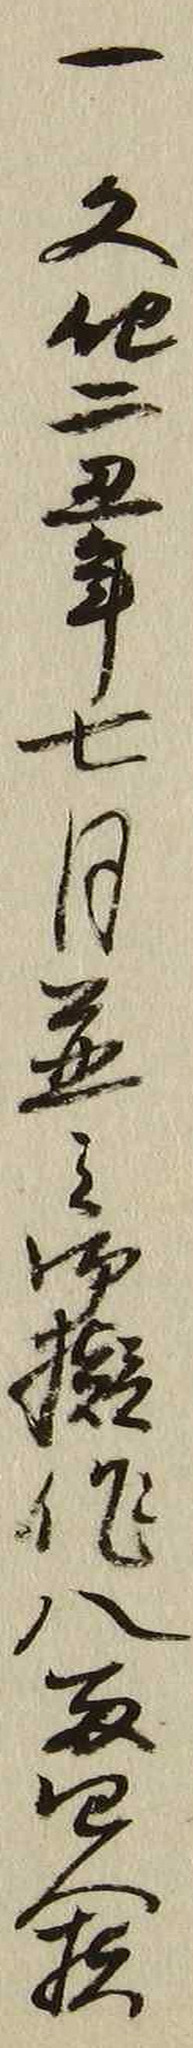一文化二丑年七月並之御擬作八両四人扶
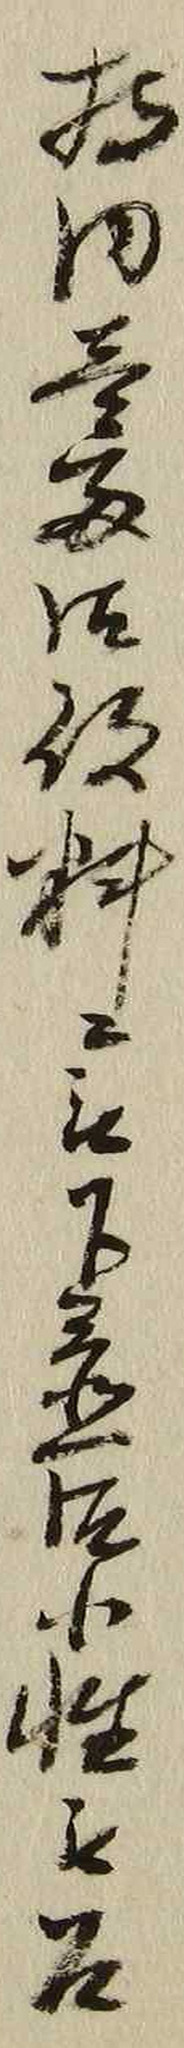持内壱両御役料ニ被下置御小性被召
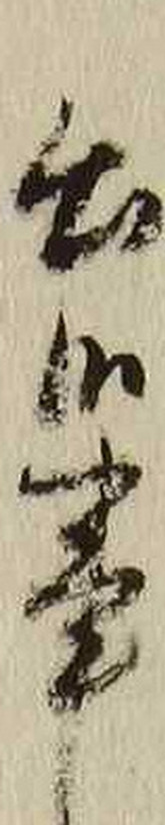出候事
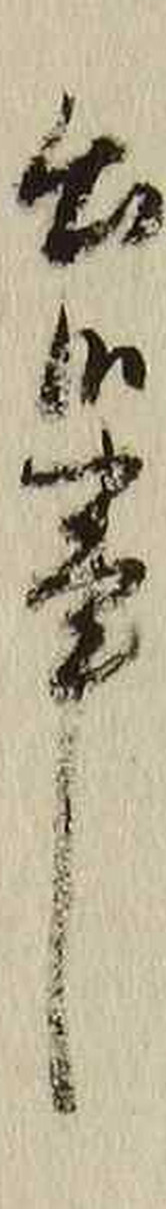出候事
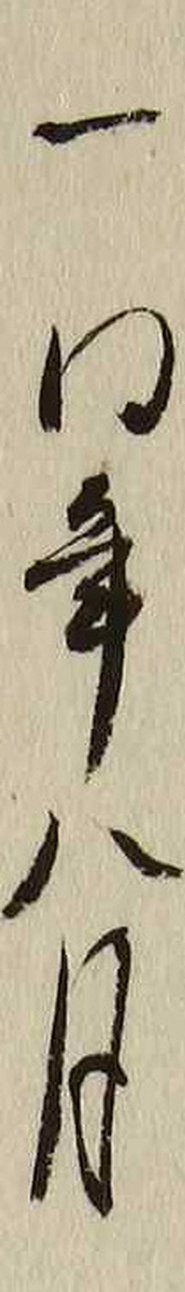一同年八月
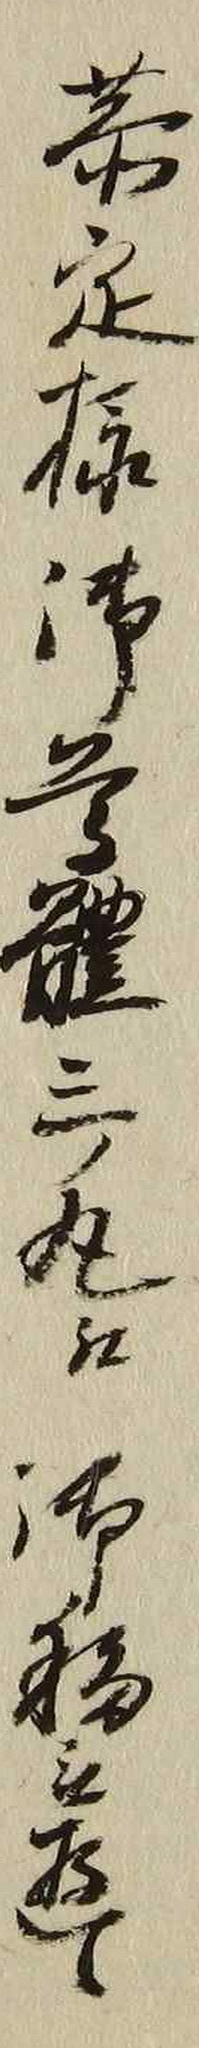恭定様御尊体三ノ丸江御移被遊候
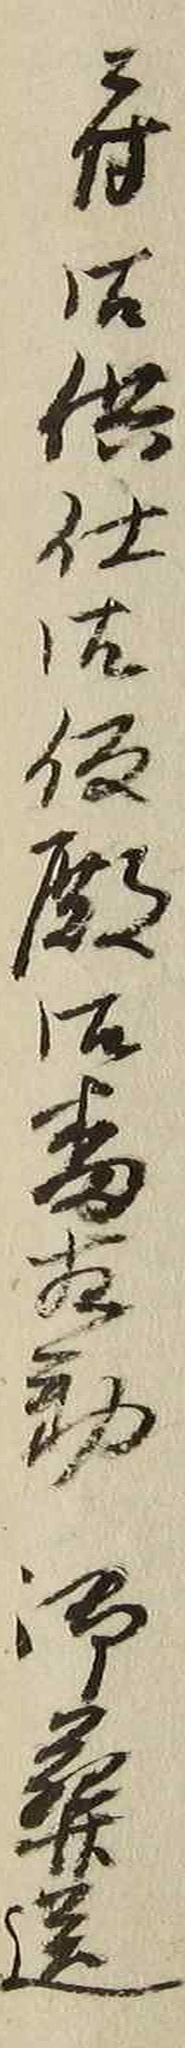ニ付御供仕御仮殿御番相勤御葬送
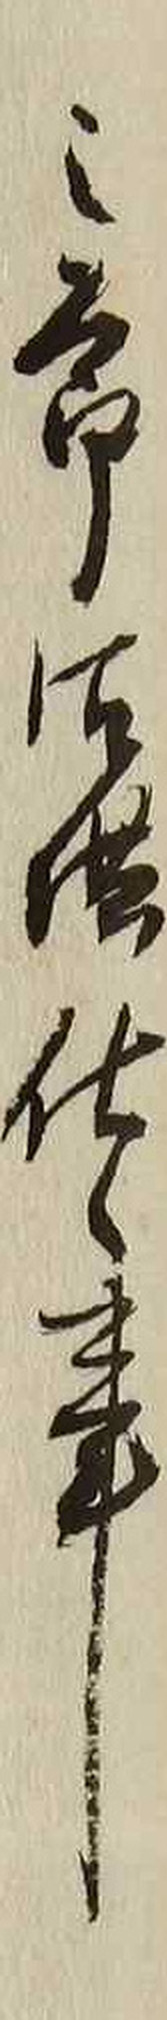之節御供仕候事
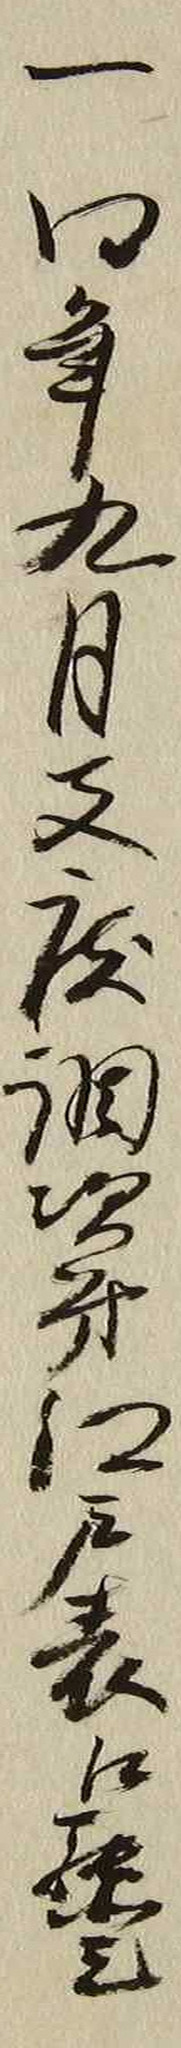一同年九月支度調次第江戸表江罷登
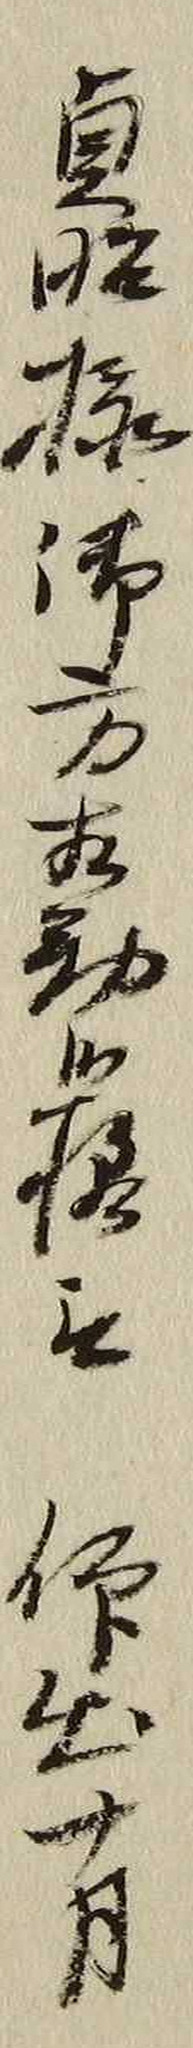貞昭様御方相勤候様被仰出十月
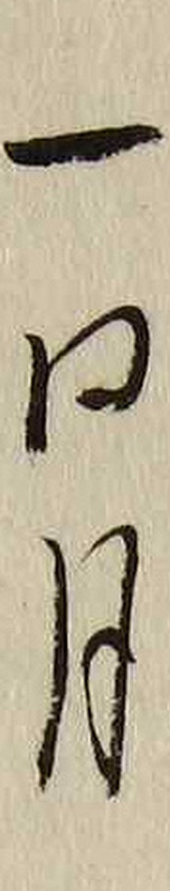一同月
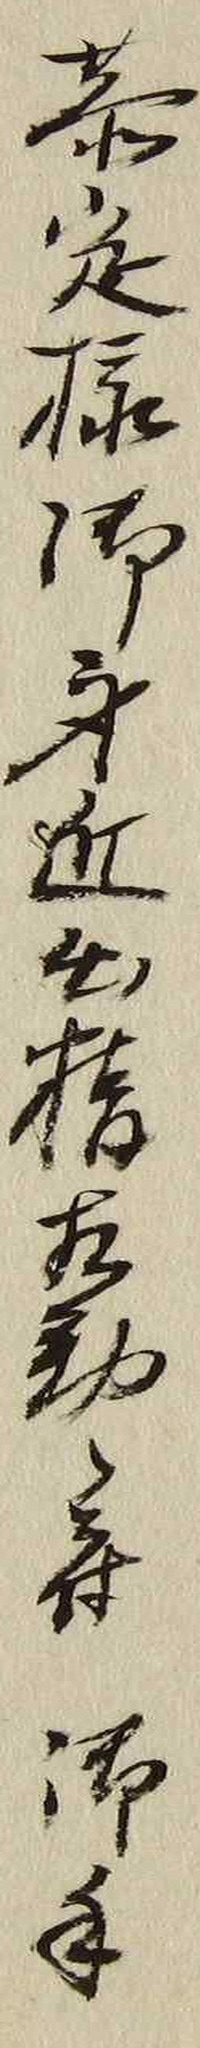恭定様御身近出精相勤候ニ付御手
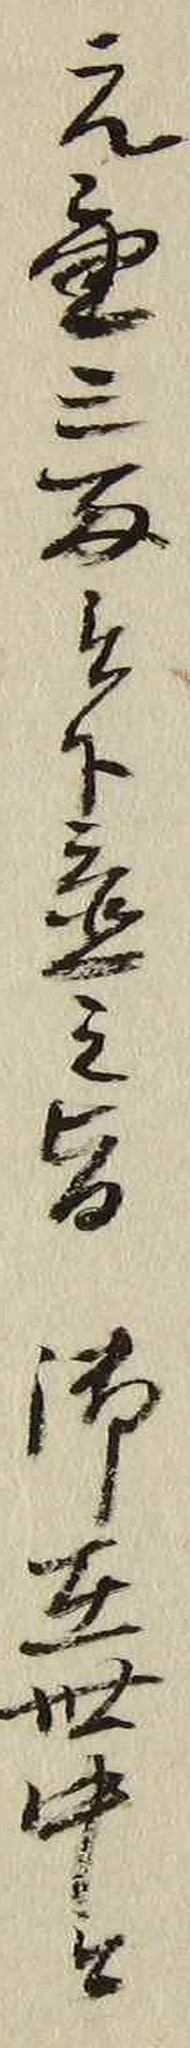元金三両被下置之旨御在世中被
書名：諸士系譜　巻之345　も之部1
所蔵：会津若松市立会津図書館
